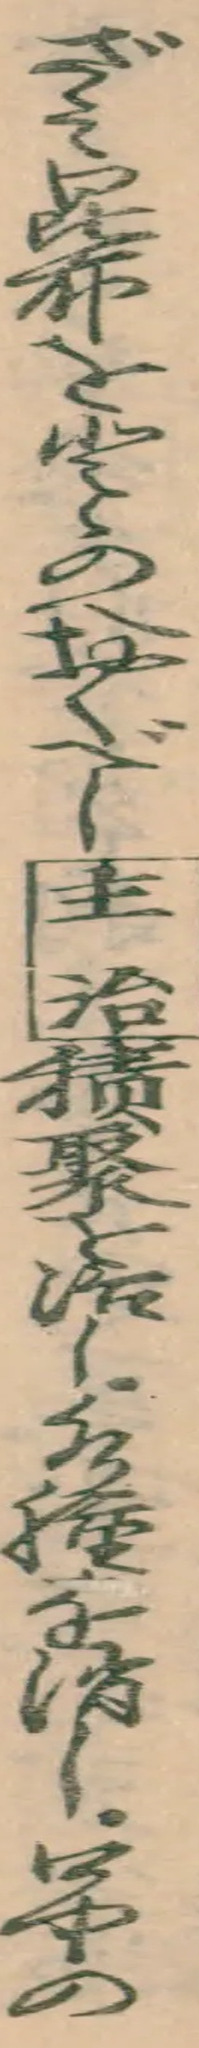ざみ昆布をとゝのへおくべし[主治]積聚を治し．水腫を消し．口中の
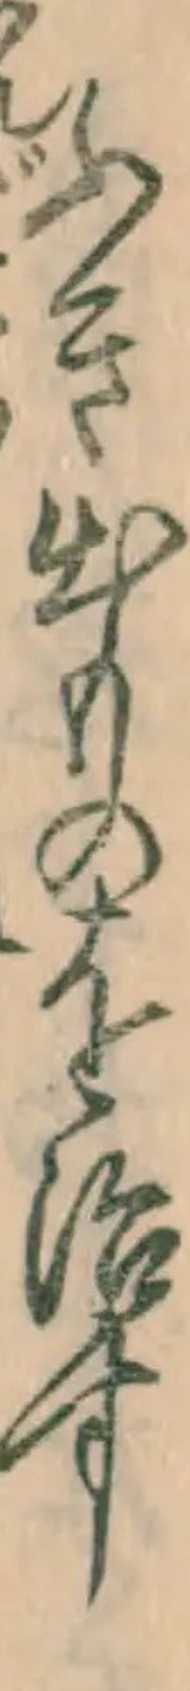ふき出ものを治す
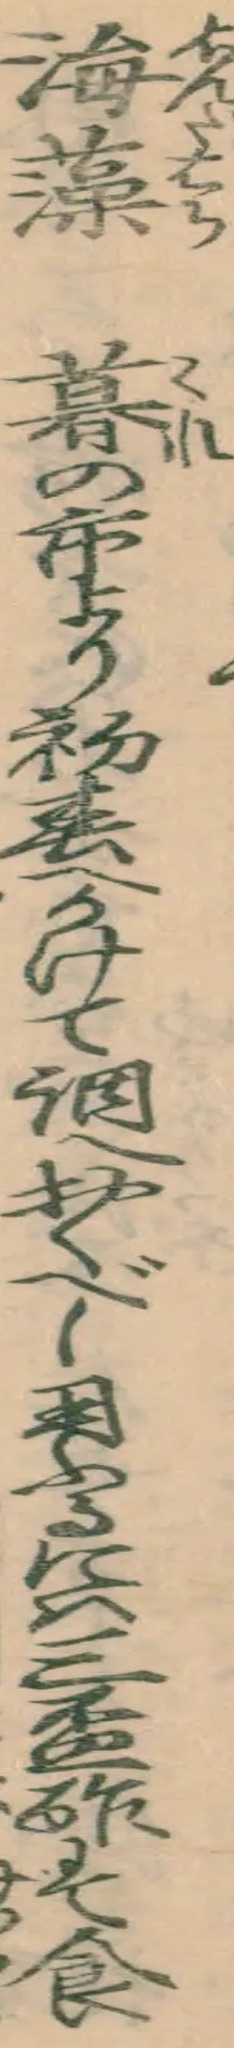海藻暮の市より初春へかけて調へおくべし用ふるには三盃酢にて食
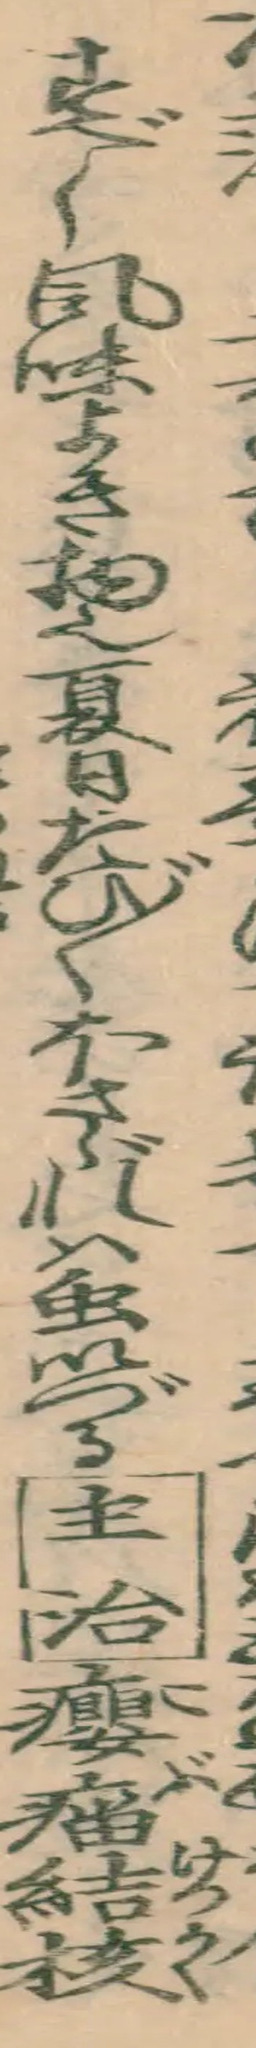すべし風味よき物也夏日たび〳〵ほさゞれは虫いづる[主治]癭瘤結核
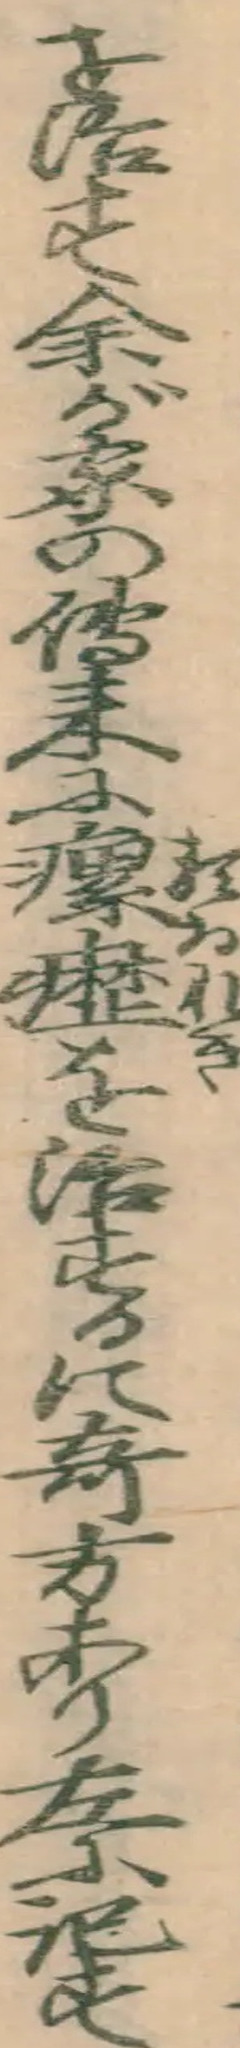を治す余が家の伝来に瘰癧を治するに奇方あり左に記す

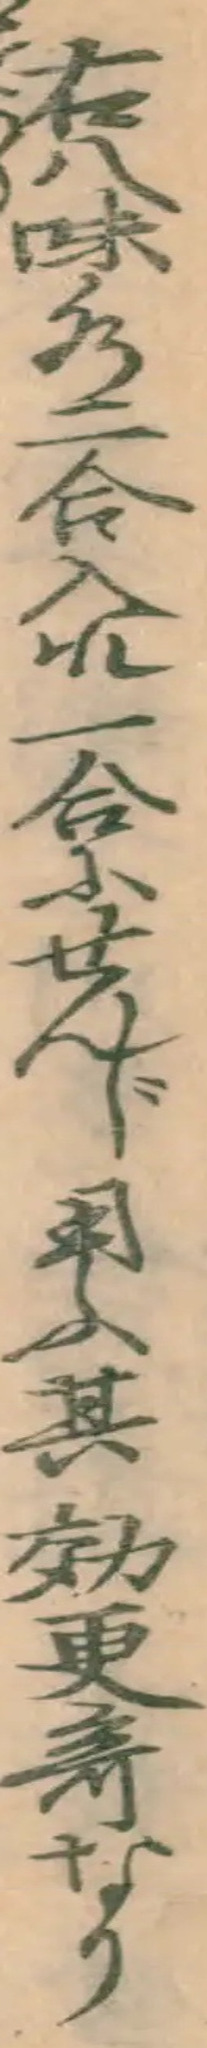右八味水二合入れ一合にせんじ用ふ其効更奇なり
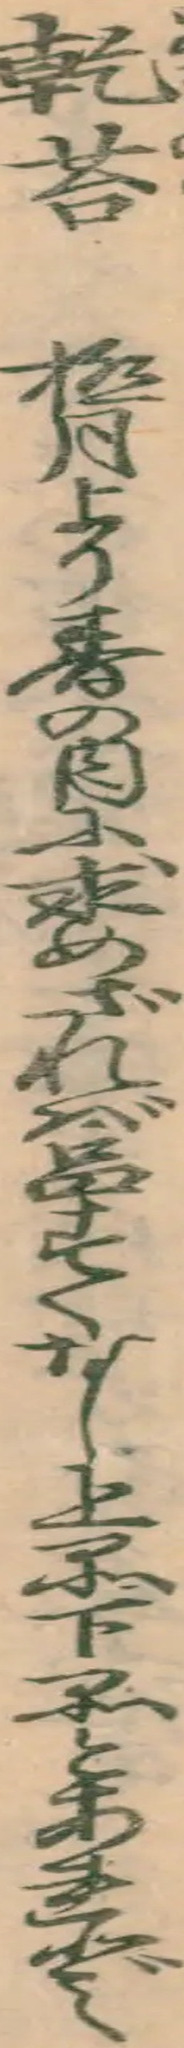乾苔極月より春の月に求めざれば品すくなし上品下品とあれど
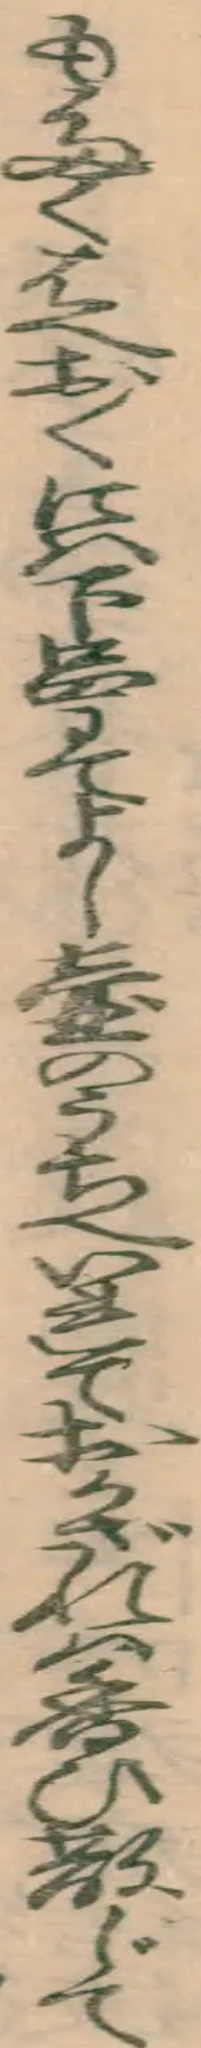もたくはへおくには下品にてよし壺のうちへいれておかざれは香ひ散じて
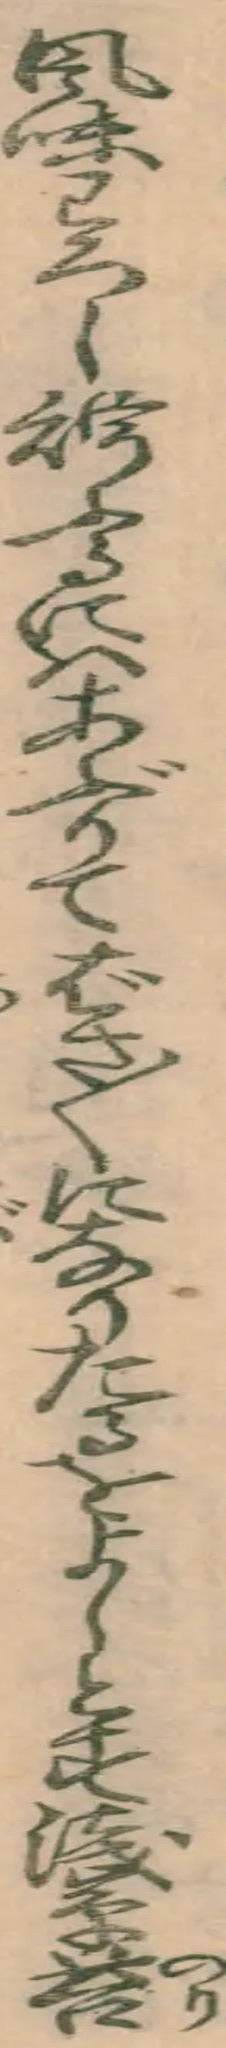風味わろし貯ふるにはあぶりてばさ〳〵になりたるをよしとす浅草苔
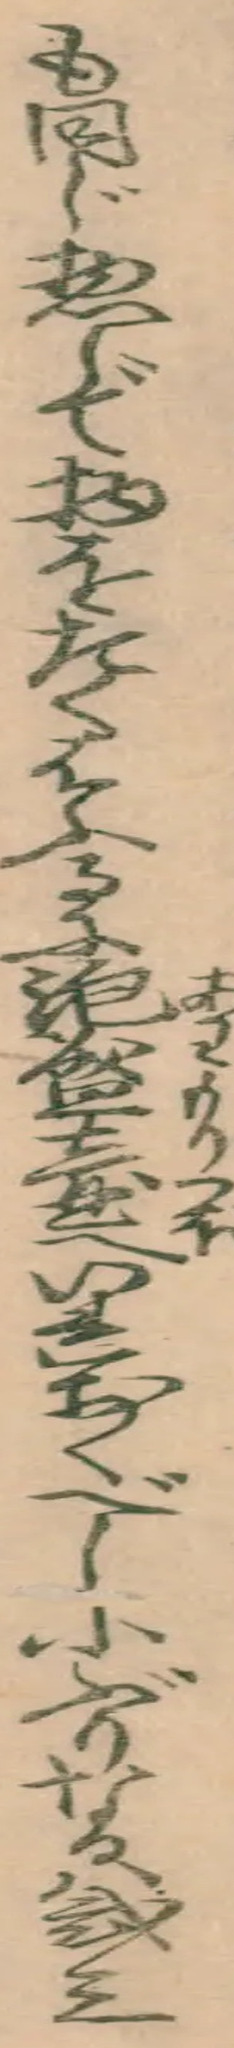も同じ惣じて物をたくはふるに泡盛壺へいれおくべし小ぶりなるは弐三
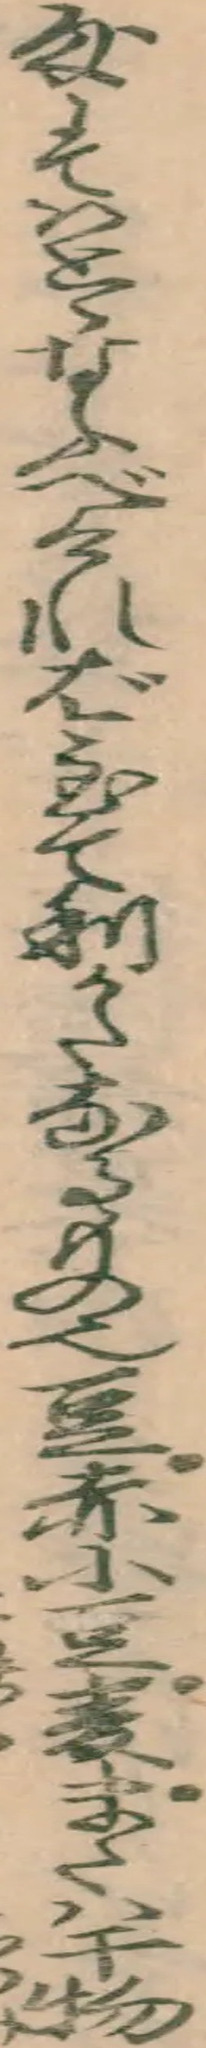匁にてはとゝなふべければ至て利かたなるもの也豆．赤小豆．麦．または干物
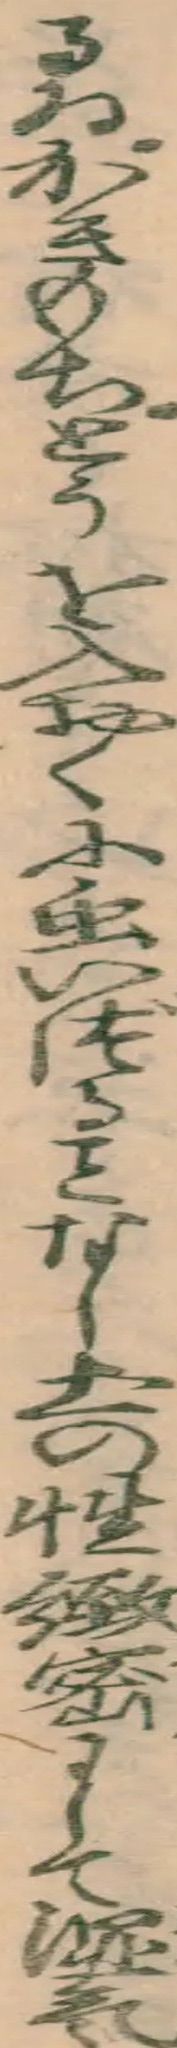るゐ．かきもち．とうを入おくに虫いづることなし土の性緻密にして湿気
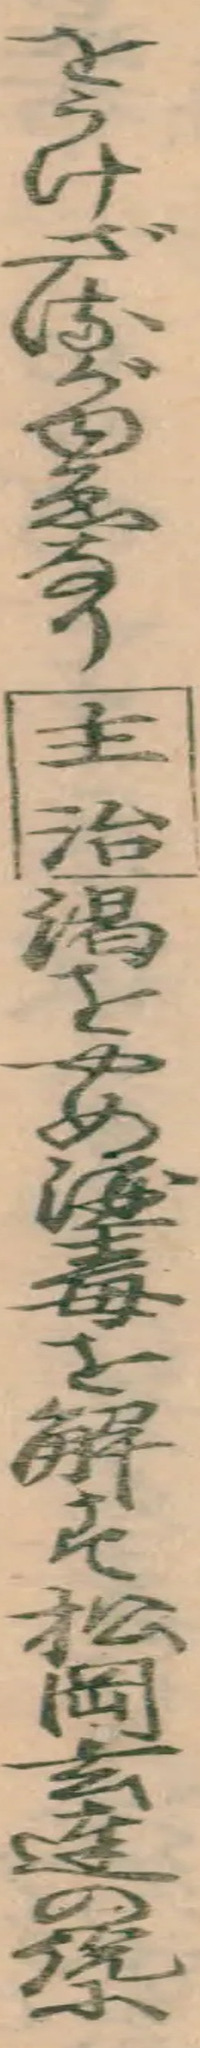をうけざるがゆゑなり[主治]渇をやめ湿毒を解す松岡玄達の説に
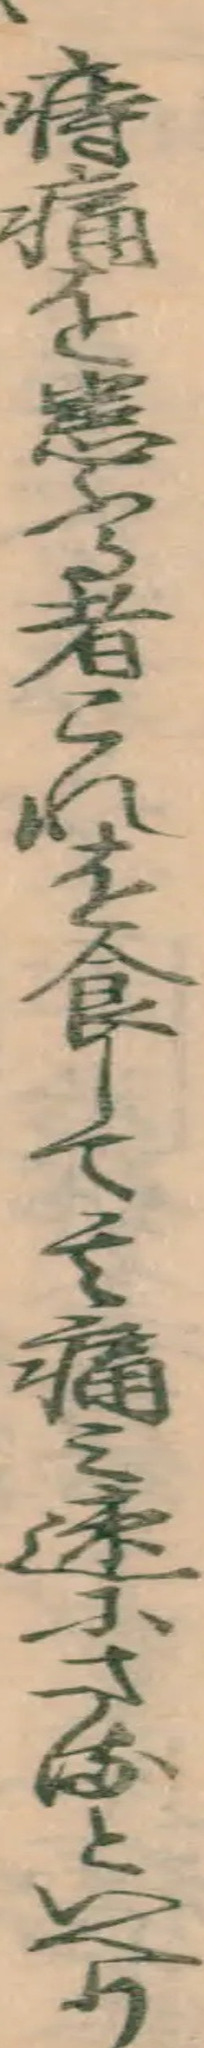痔痛を患ふる者これを食して其痛み速にさるといへり
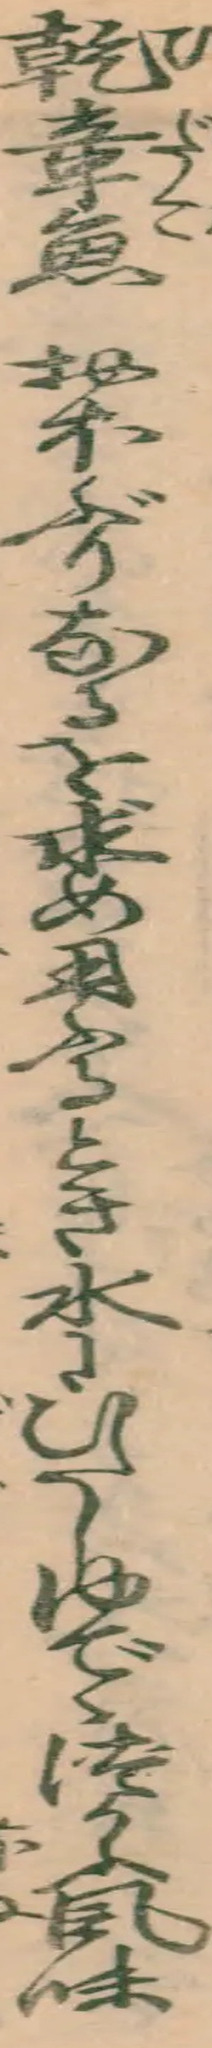乾章魚おほぶりなるを求め用ふるとき水にひたしゆでゝつかふ風味
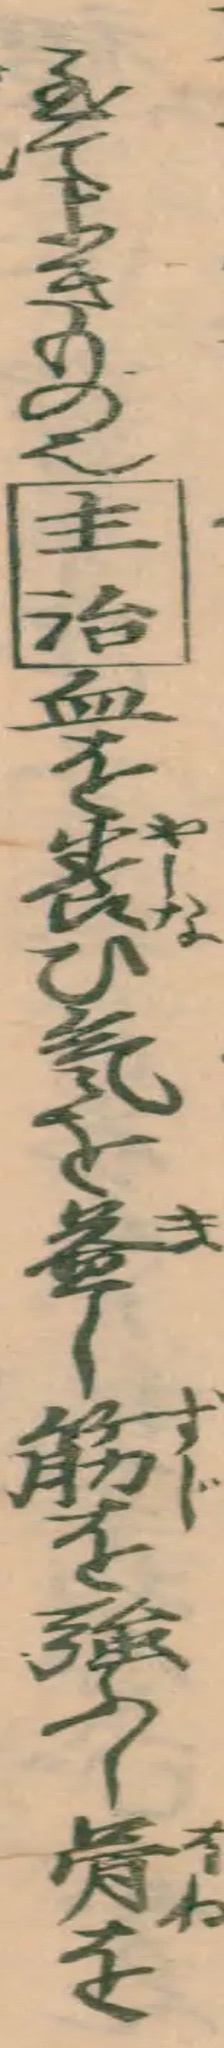至てよきもの也[主治]血を養ひ気を益し筋を強ふし骨を
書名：日ごとの心得
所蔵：国立国会図書館 National Diet Library, JAPAN
